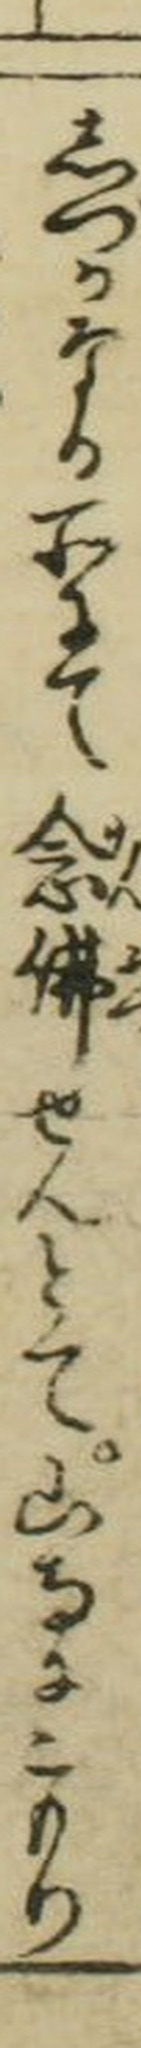しづかなる所にて念佛せんとて。山寺にこもり
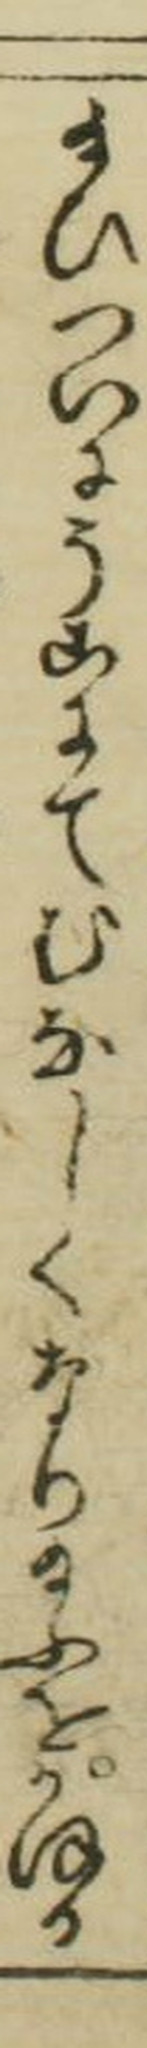給ひついにそこにてむなしくなり給ふを。かほる
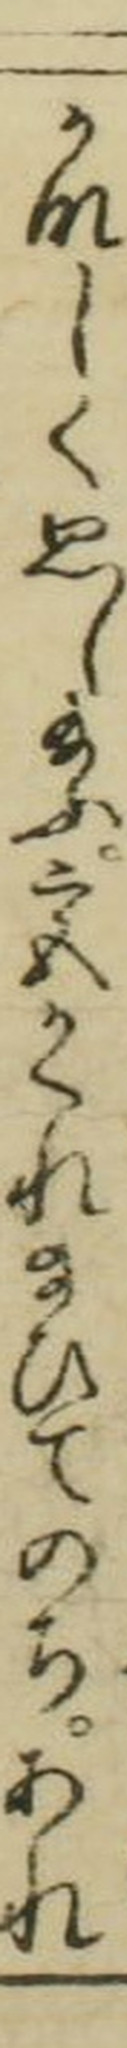かなしく思し給ふ。宮かくれ給ひてのち。あれ
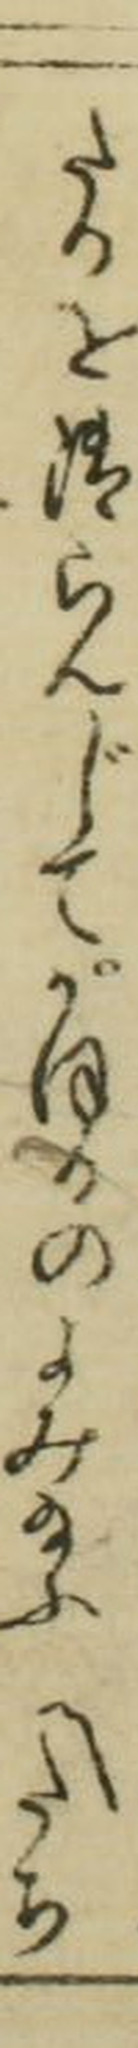たるを御らんじて。かほるのよみ給ふ〽たち
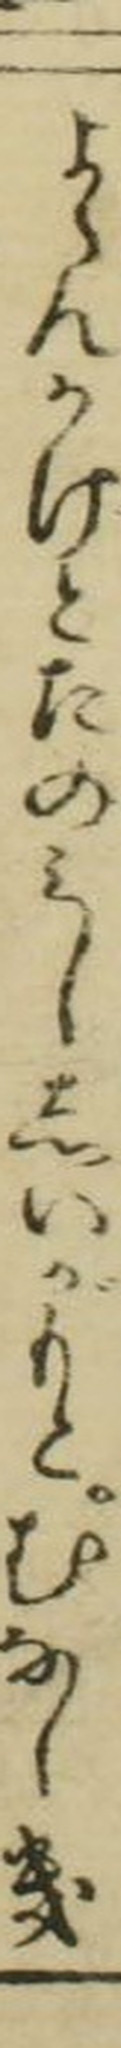よらんかげとたのみししいがもと。むなしき
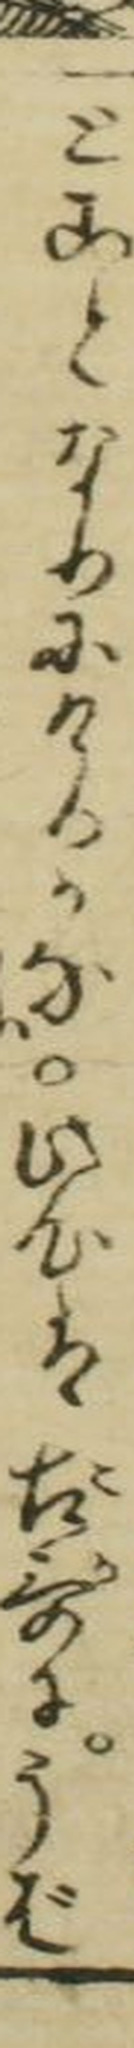とことなりにけるかな◯此心は古哥に。うば
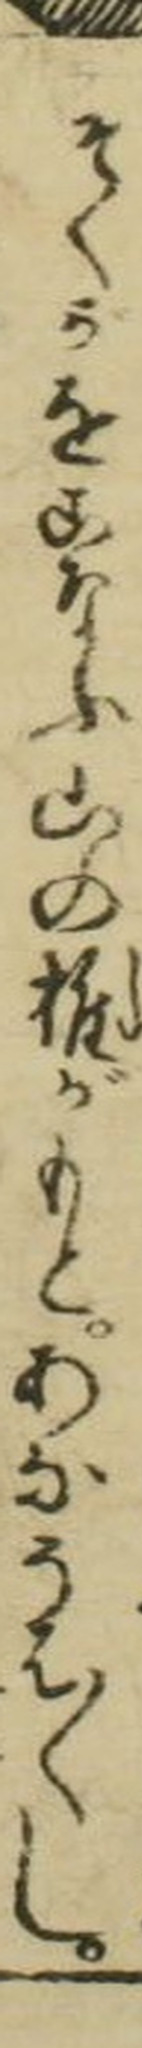そくがをこなふ山の椎がもと。あなうは〳〵し。
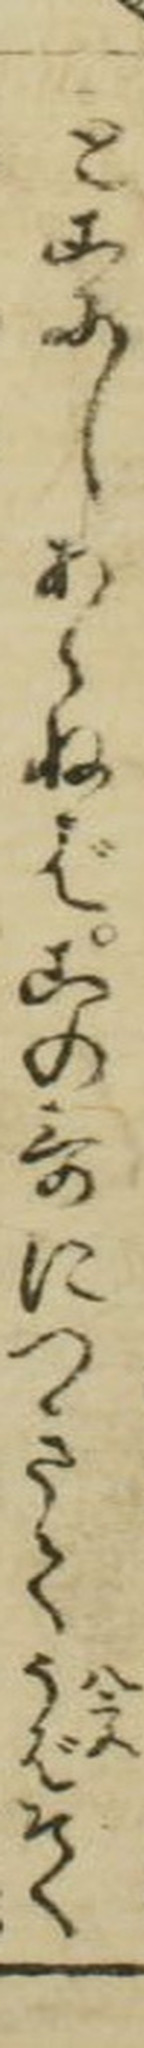とこにしあらねば。この哥につきてうばそく
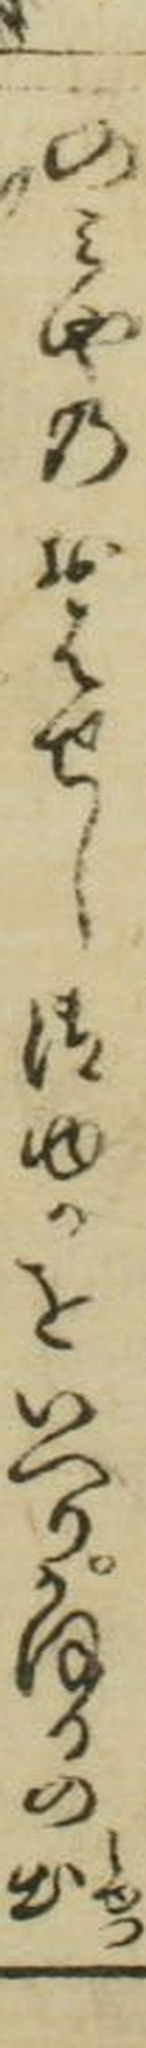のみやのおはせし御ゆかをいへり。かほるの出
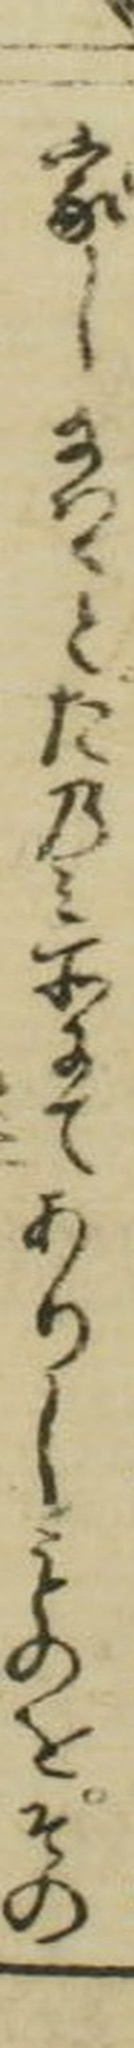家し給はゝと。たのみ所にてありしものを。その
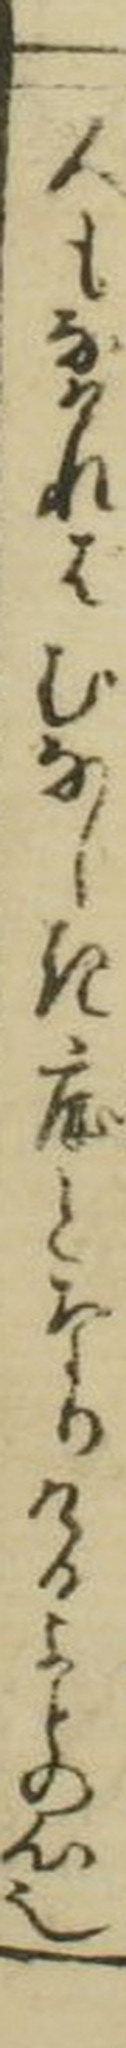人もなければむなしき床となりけるよとの心也
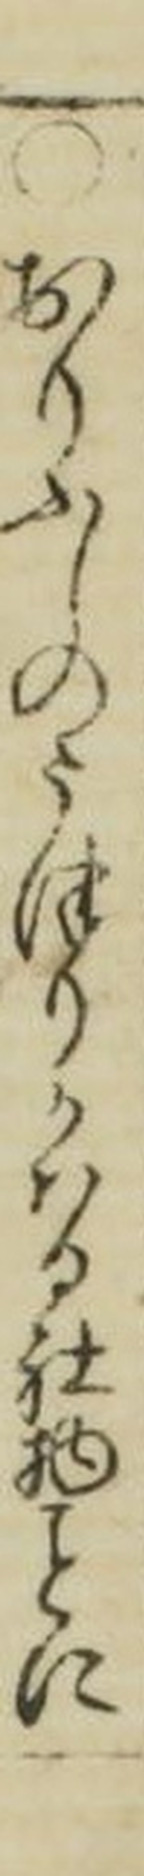◯おりふしのうつりかはる社物ことに
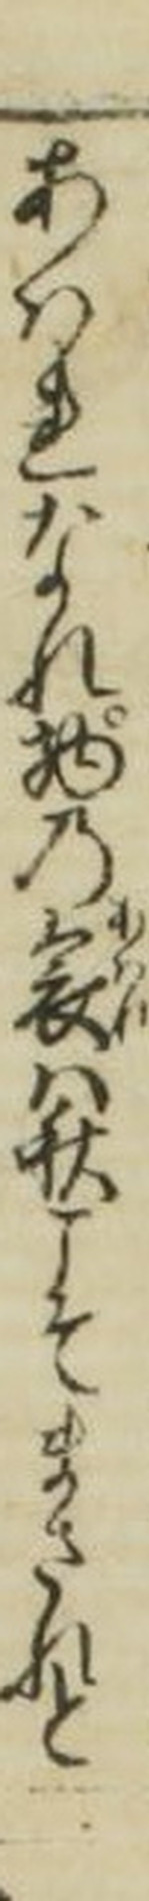あはれなれ。物の哀は秋こそまされと
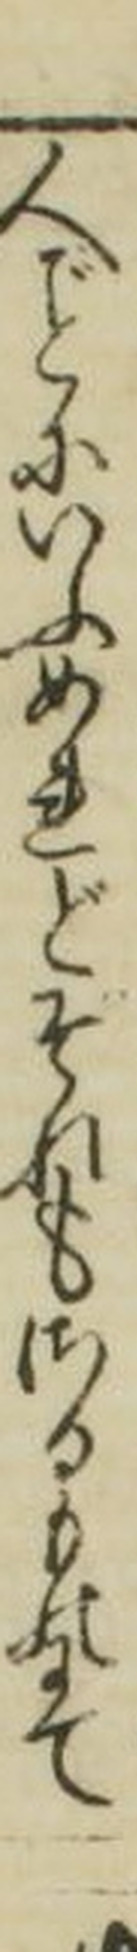人ごとにいふめれど。それもさるものにて
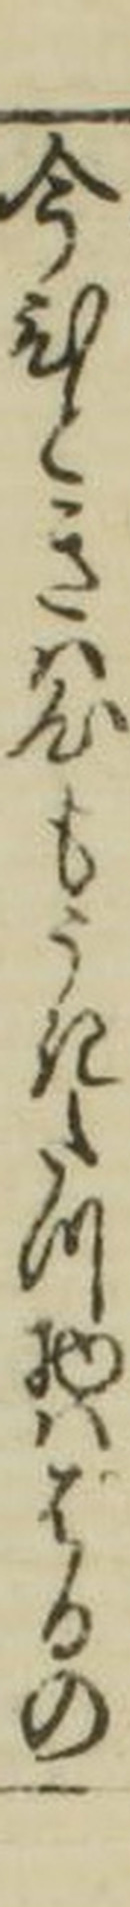今ひときは心もうきたつ物は。はるの
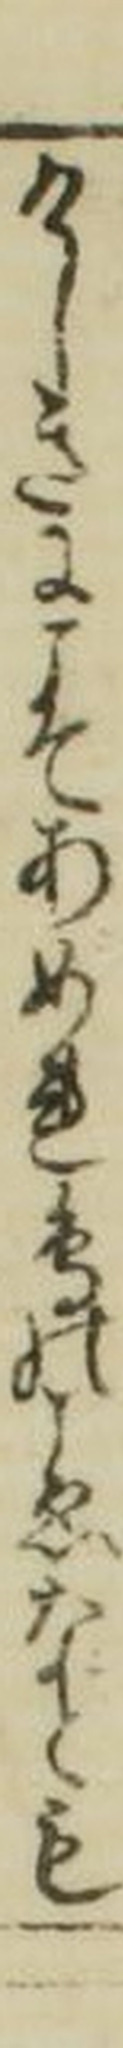けしきにこそあめれ鳥のこゑなども
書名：女源氏教訓鑑
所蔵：東京学芸大学附属図書館
